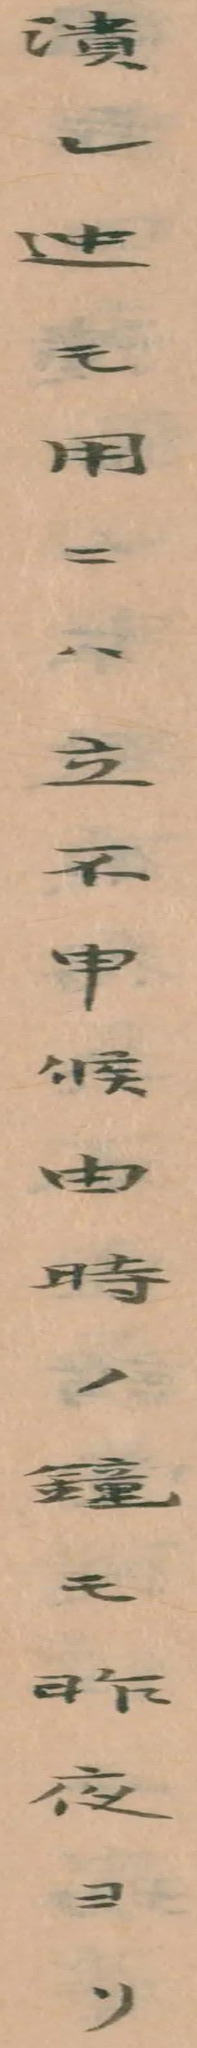潰レ迚モ用ニハ立不申候由時ノ鐘モ昨夜ヨリ
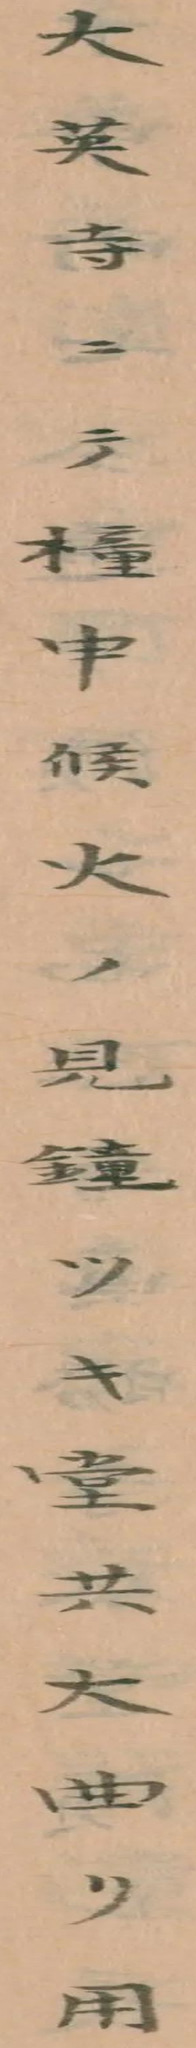大英寺ニテ撞申候火ノ見鐘ツキ堂共大曲リ用
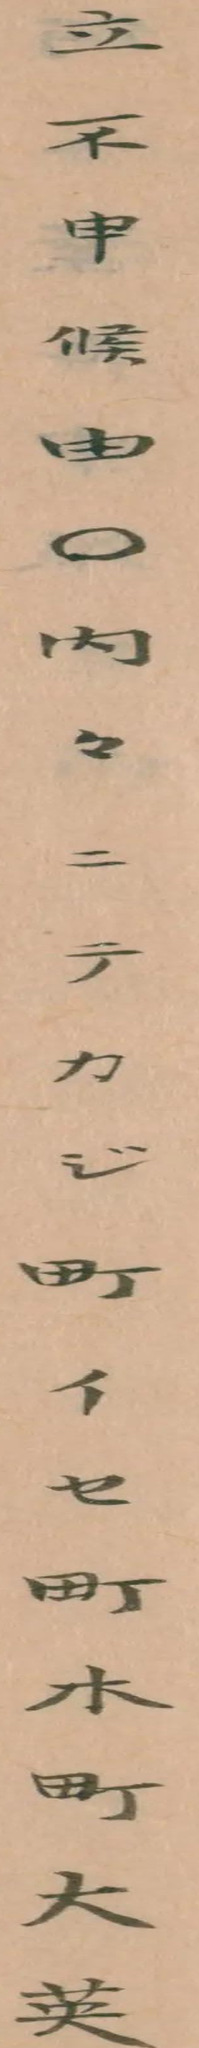立不申候由〇内々ニテカジ町イセ町木長大英
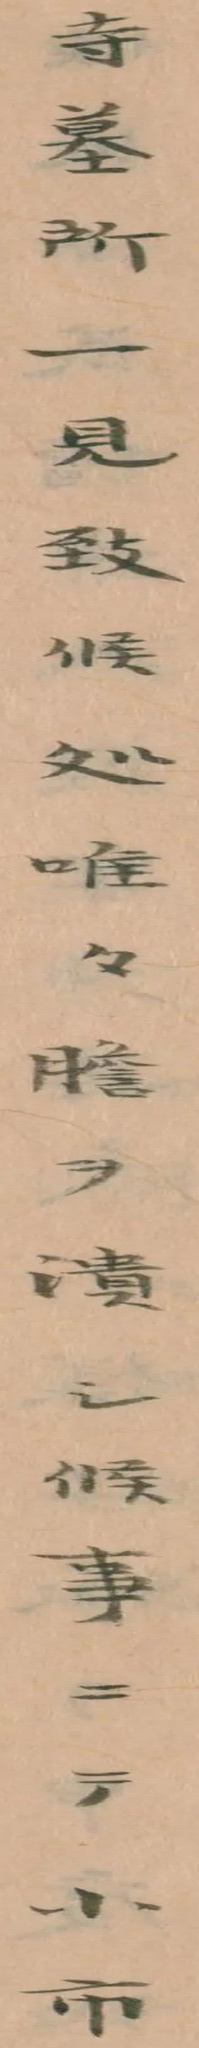寺墓所一見致候処唯々膽ヲ潰シ候事二テ小市
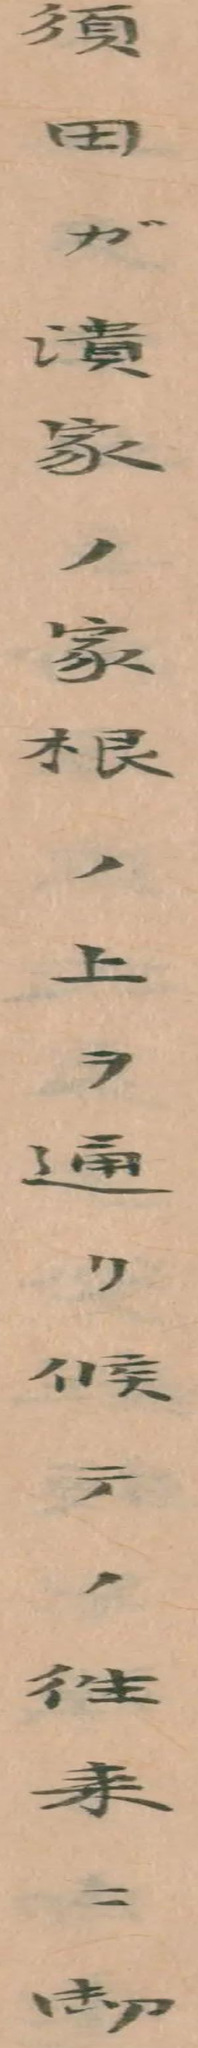須田ガ潰家ノ家根ノ上ヲ通り候テノ往来二御
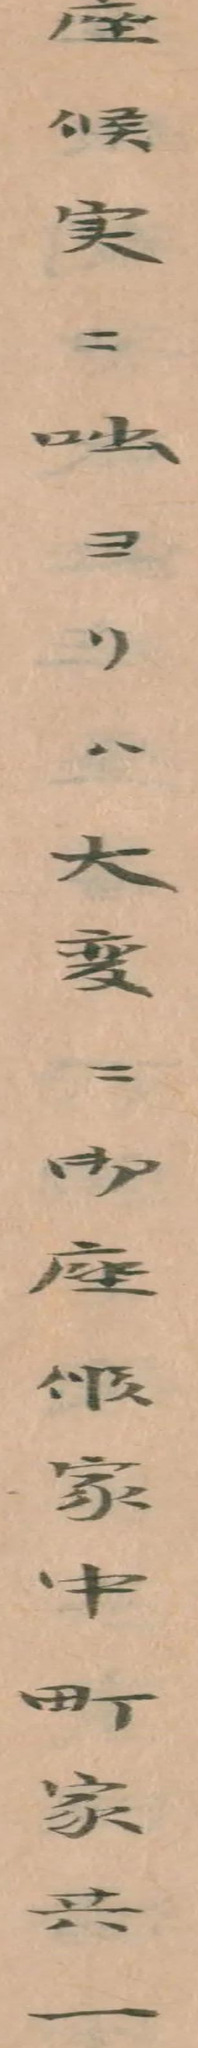座候実二咄ヨリハ大変二御座候家中町家共一
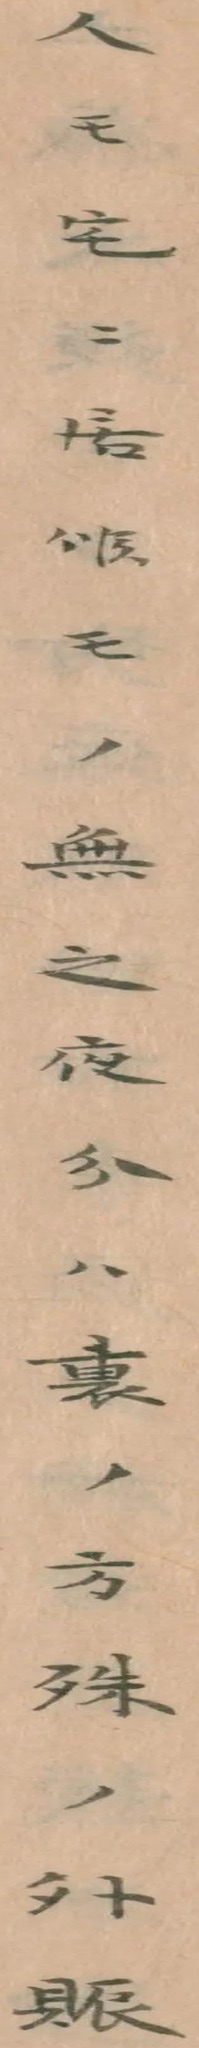人モ宅二居候モノ無之夜分ハ裏ノ方殊ノ外賑
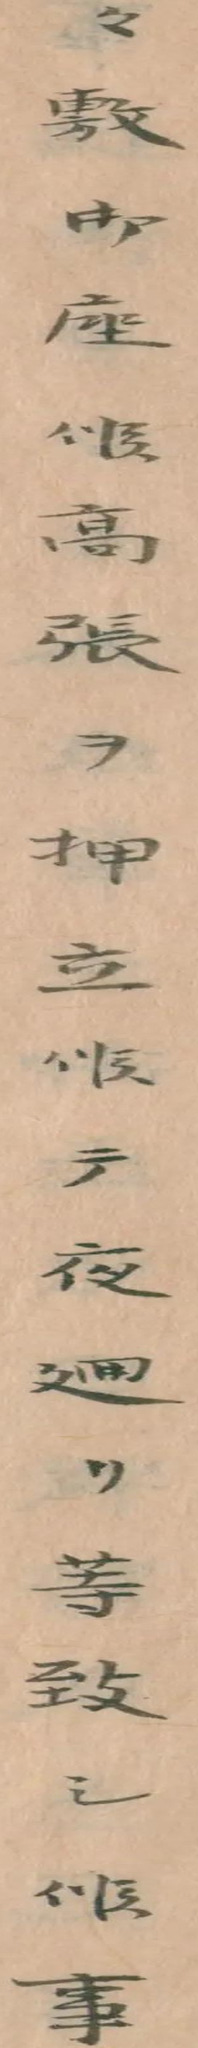々敷御座候高張ヲ押立候テ夜廻り等致シ候事
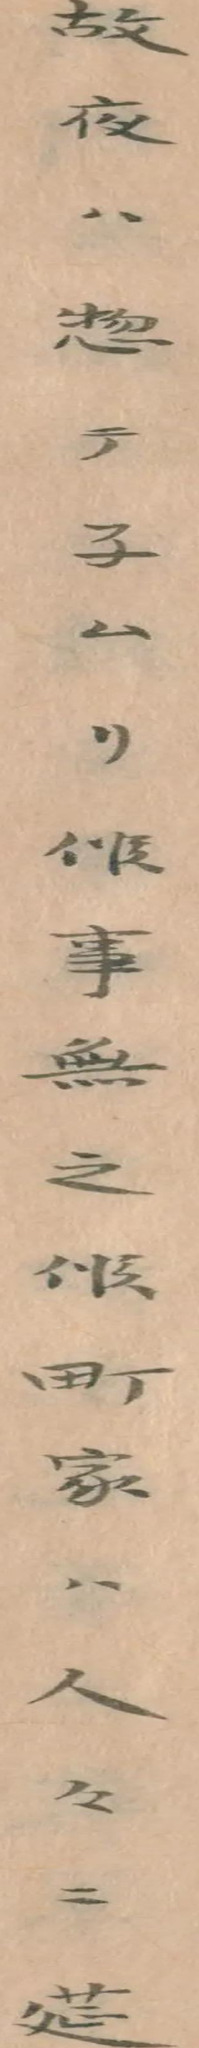故夜ハ惣テ子ムリ候事無之候町家ハ人々二筵
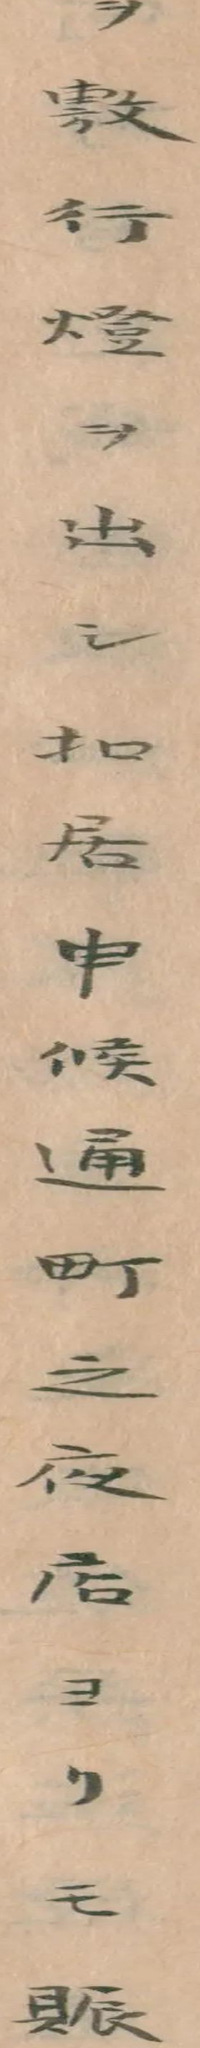ヲ敷行燈ヲ出シ扣居申候通町之夜店ヨリモ賑
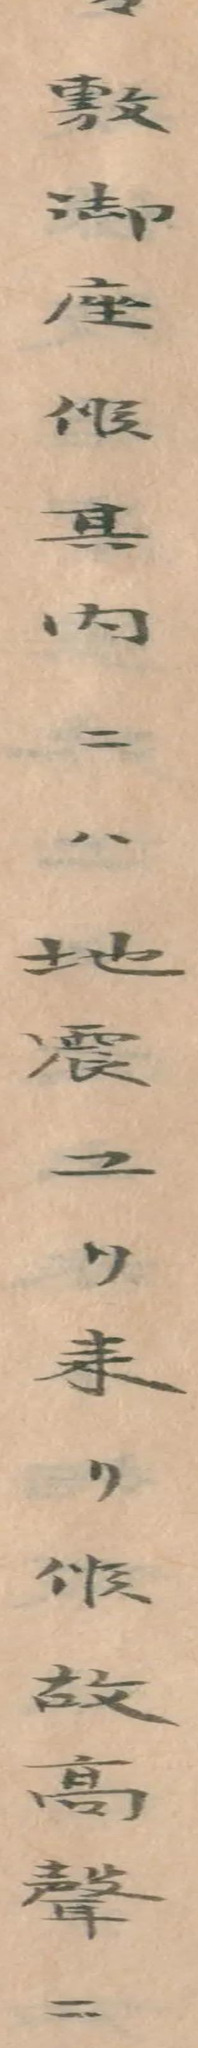々敷御座候其内ニハ地震ユリ来り候故高声二
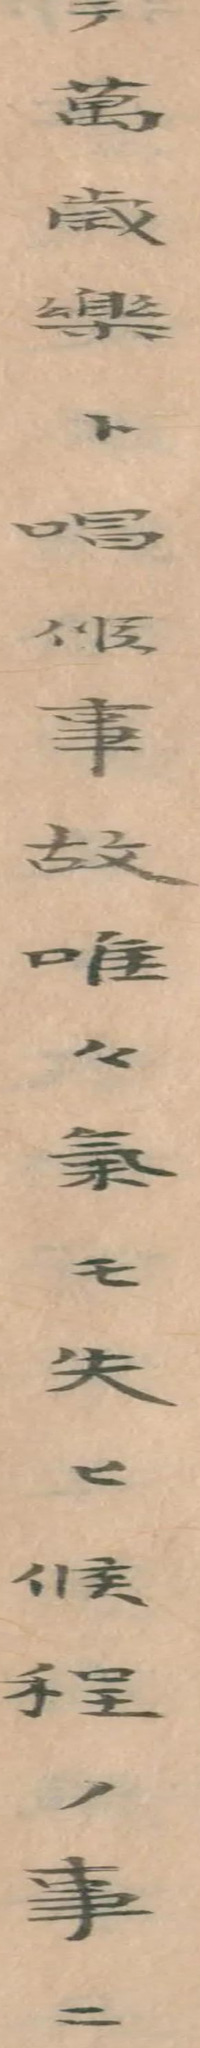テ万歳楽ト唱候事故唯々気モ失ヒ候程ノ事二

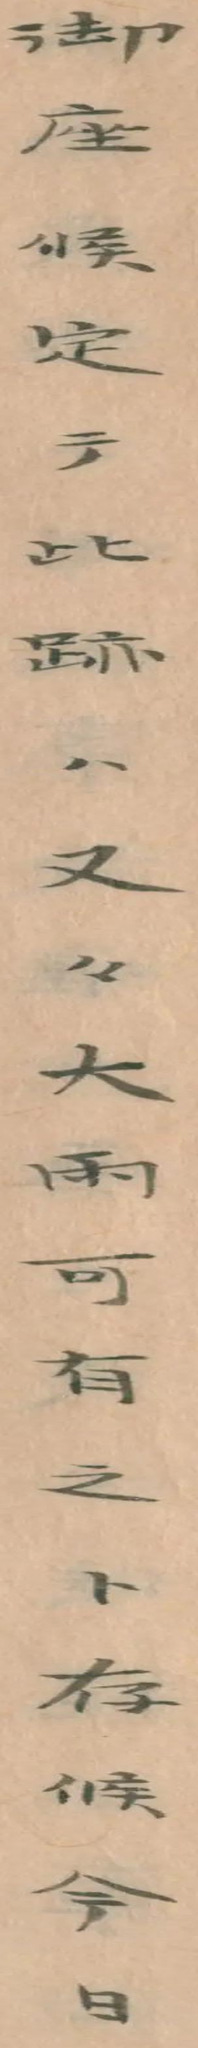御座候定テ此跡ハ又々大雨可有之ト存候今日
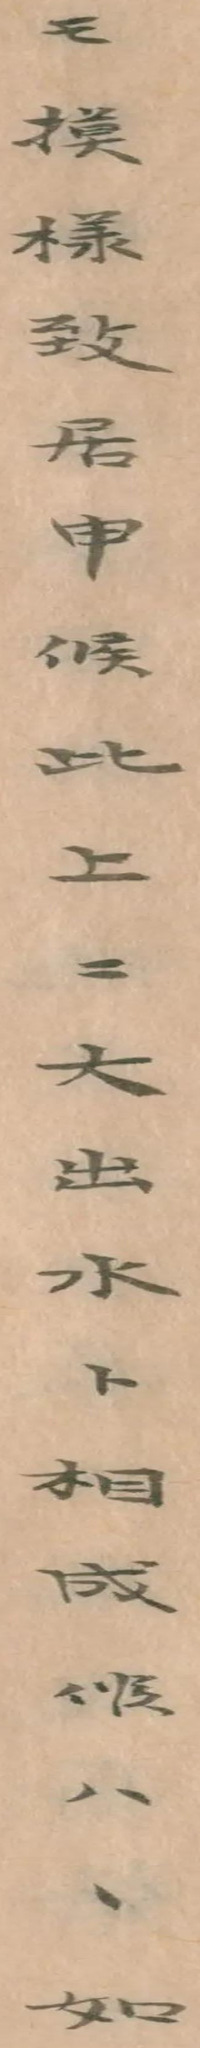モ模様致居申候此上二大出水ト相成候ハゝ如
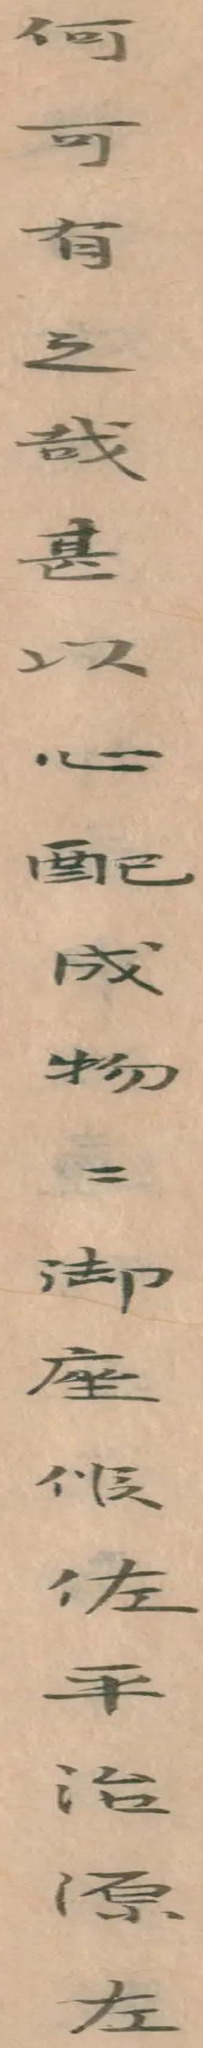何可有之哉甚以心配成物二御座候佐平治源左
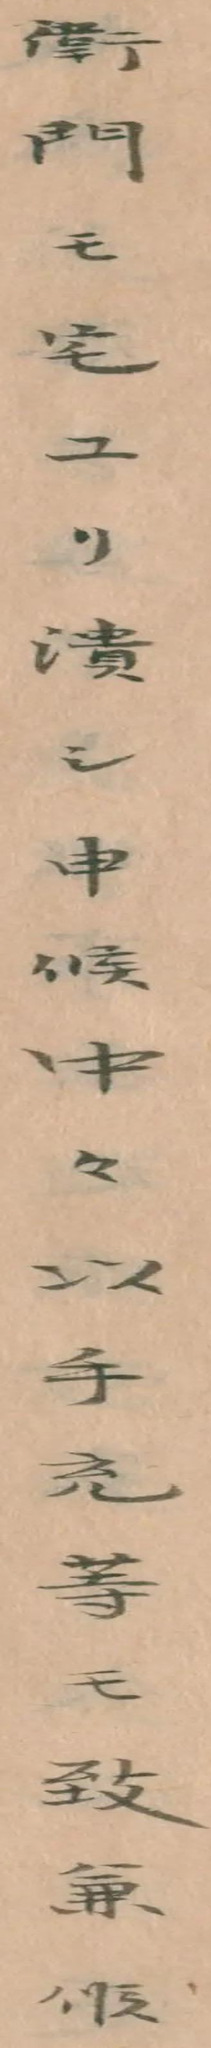衛門モ宅ユリ潰シ申候中々依手充等モ致兼候
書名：地災撮要. 巻1(噴火山・地震ノ部)
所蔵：国立国会図書館 National Diet Library, JAPAN
